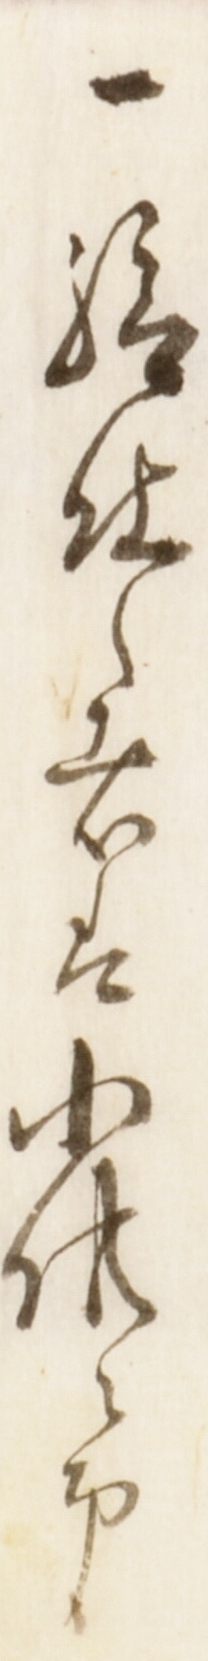一給仕候者は小供ニ而
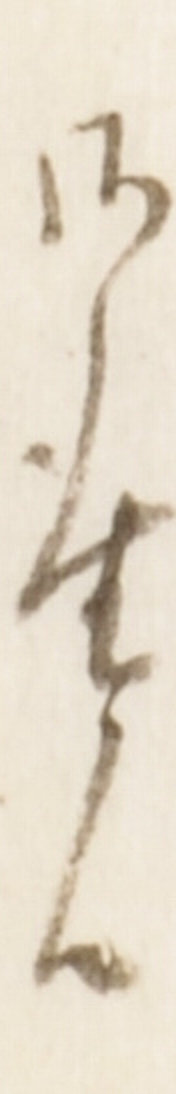御座候

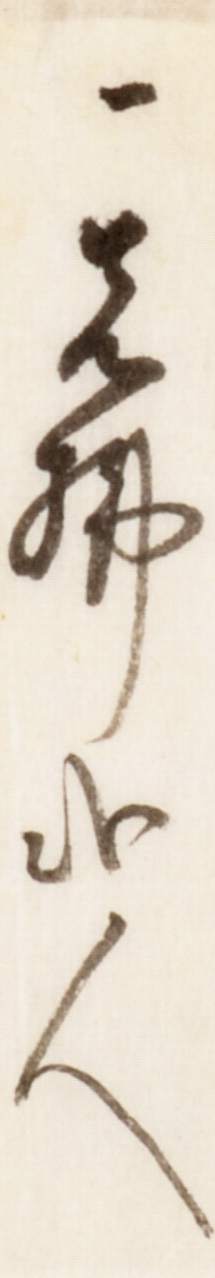一先払弐人
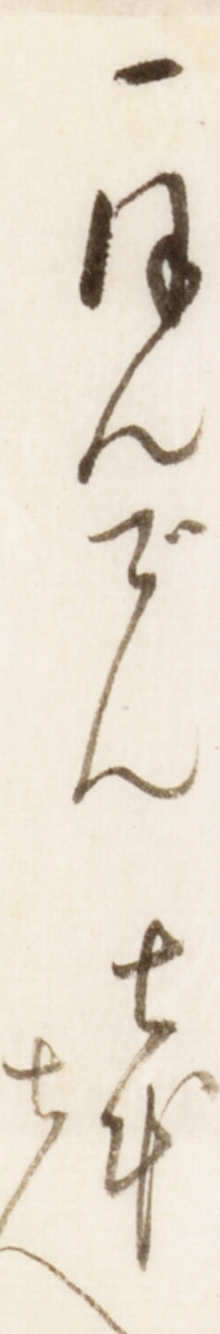一ほんでん七本
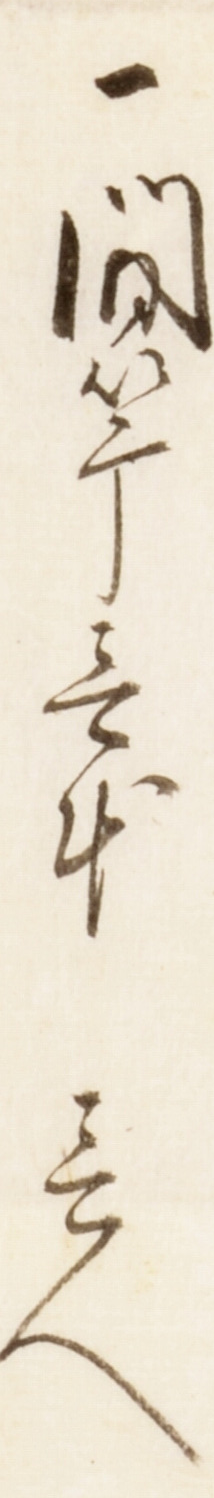一間竿壱本壱人

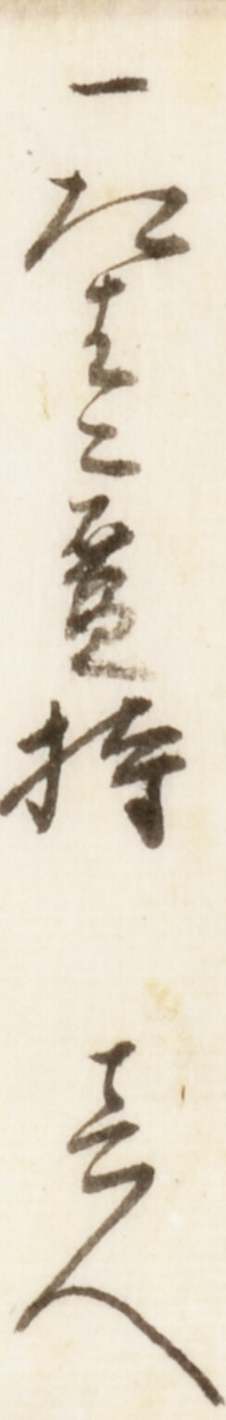一たはこ盆持壱人
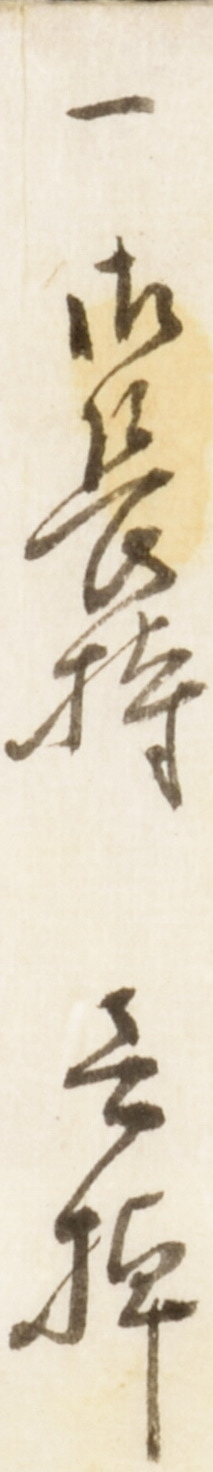一御長持壱棹
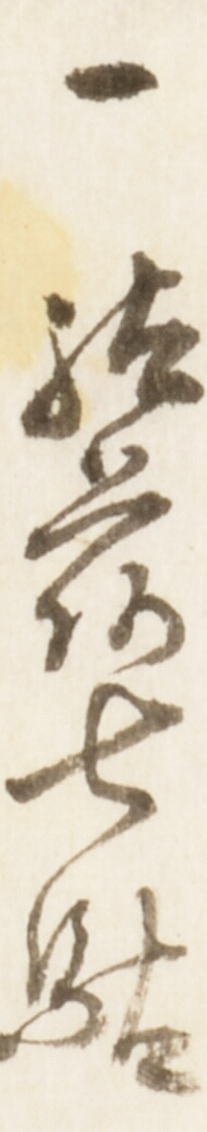一駄荷七駄
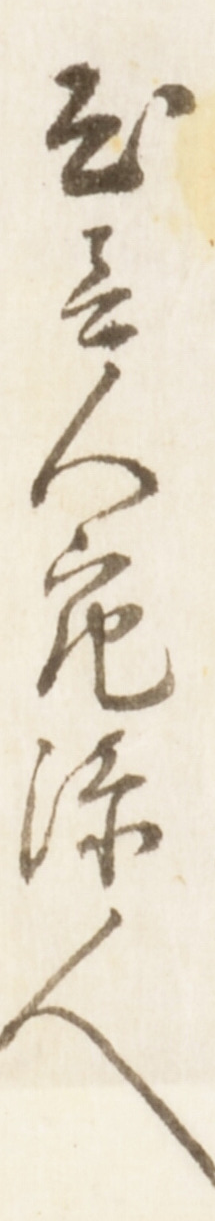尤壱人宛添人
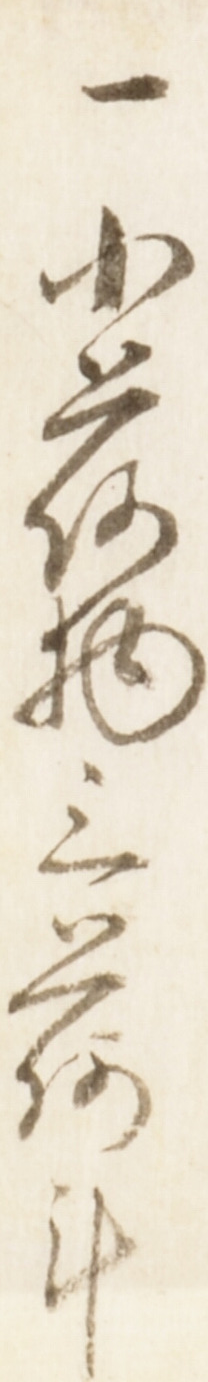一小荷物三荷斗
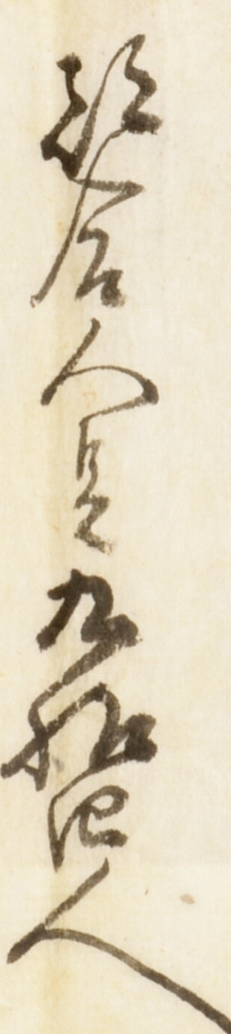都合人足九拾四人
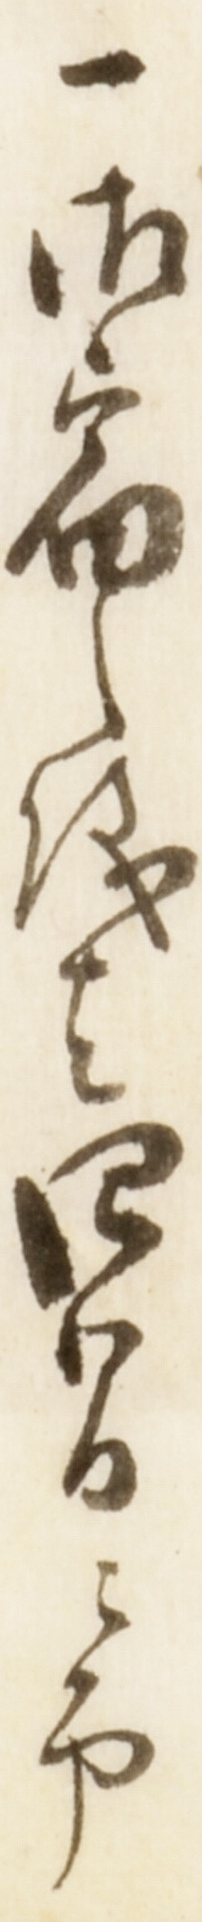一御宿之儀は四間ニ而
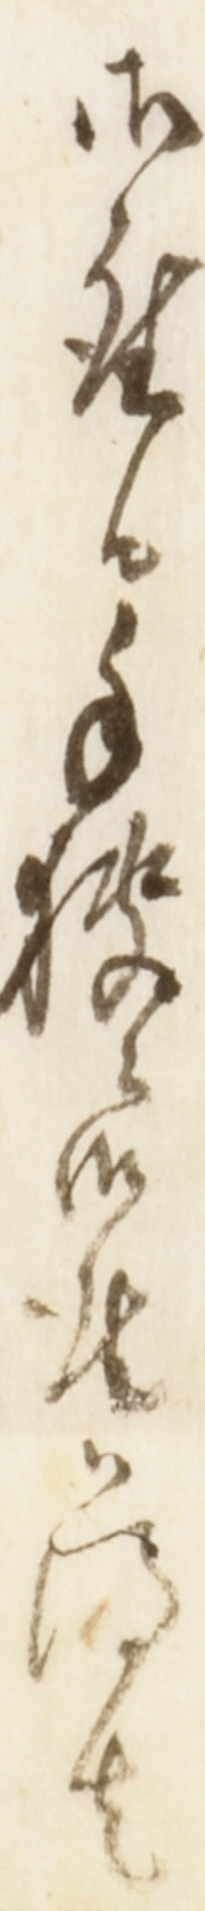御座候手狭ニ御座候得は
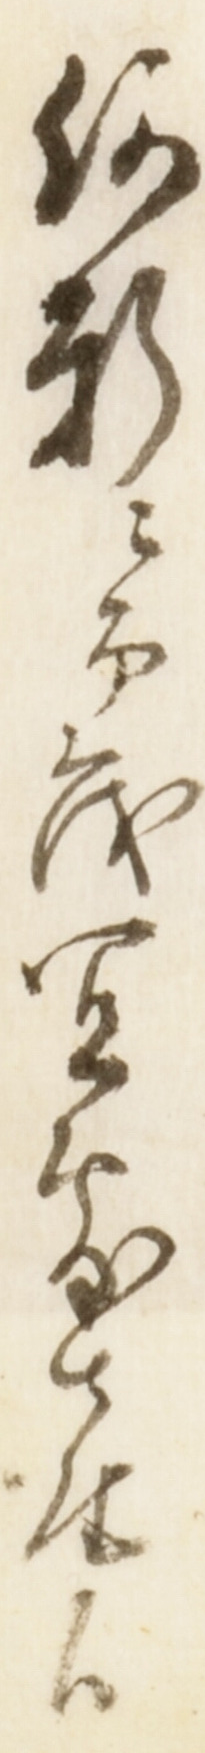何軒ニ而も宜敷御座候
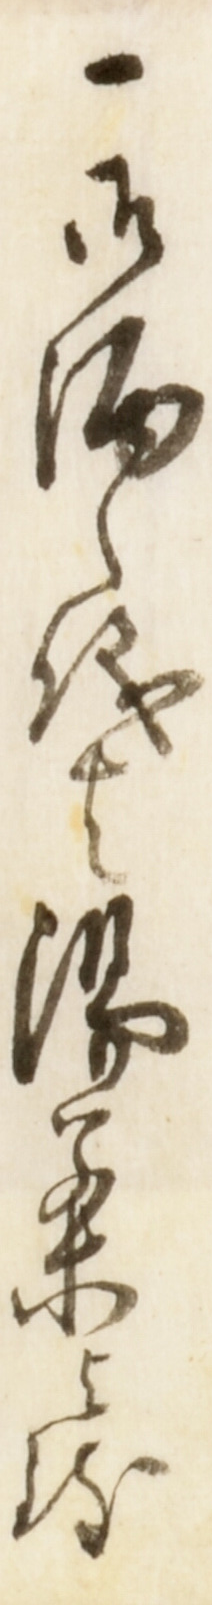一御酒之儀は湯茶と致
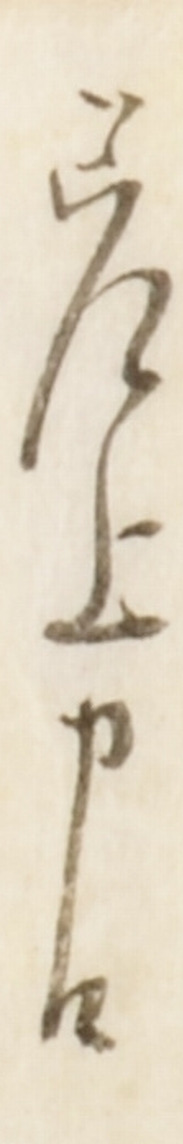差上申候
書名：（諸事控）
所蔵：伊那市立高遠町図書館・合同会社AMANE
